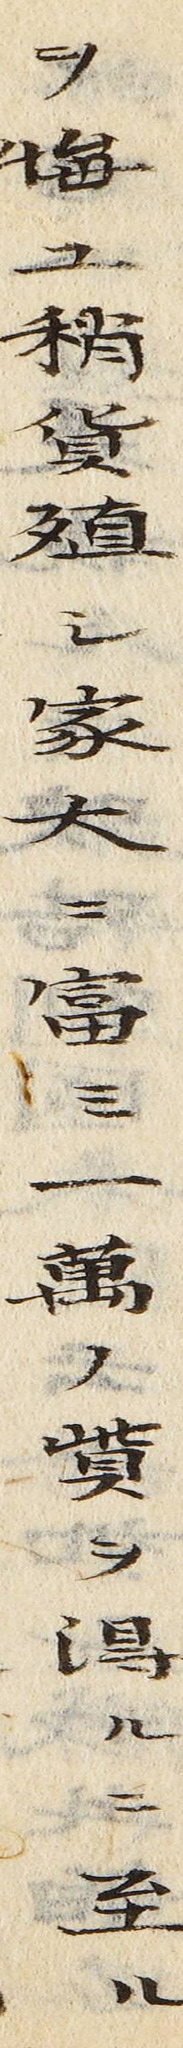ヲ悔ユ稍貨殖シ家大ニ富ミ一万ノ貲ヲ得ルニ至ル
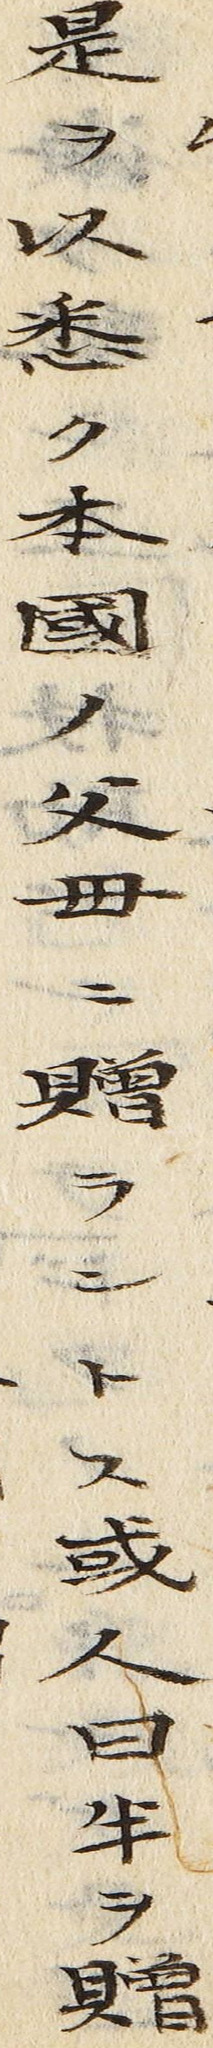是ヲ以悉ク本国ノ父母ニ贈ラントス或人曰半ヲ贈
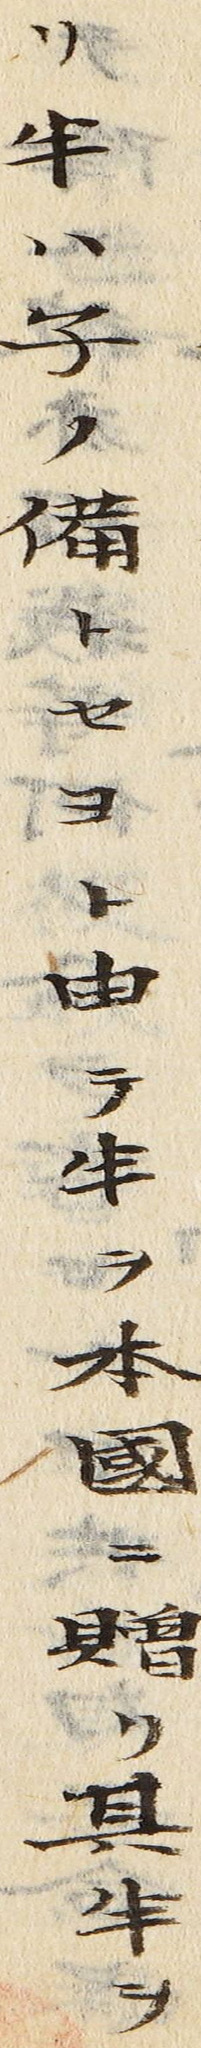リ半ハ子ノ備トセヨト由テ半ヲ本国ニ贈リ其半ヲ
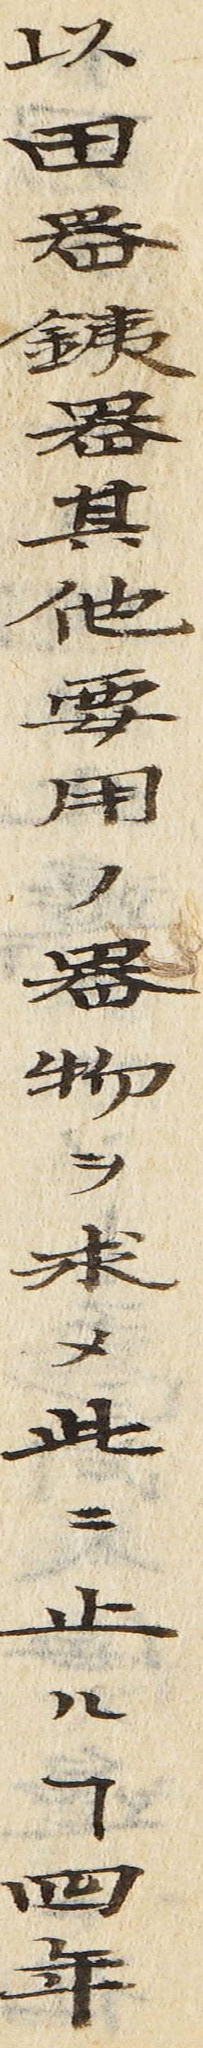以田器鉄器其他要用ノ器物ヲ求メ此ニ止ルコト四年
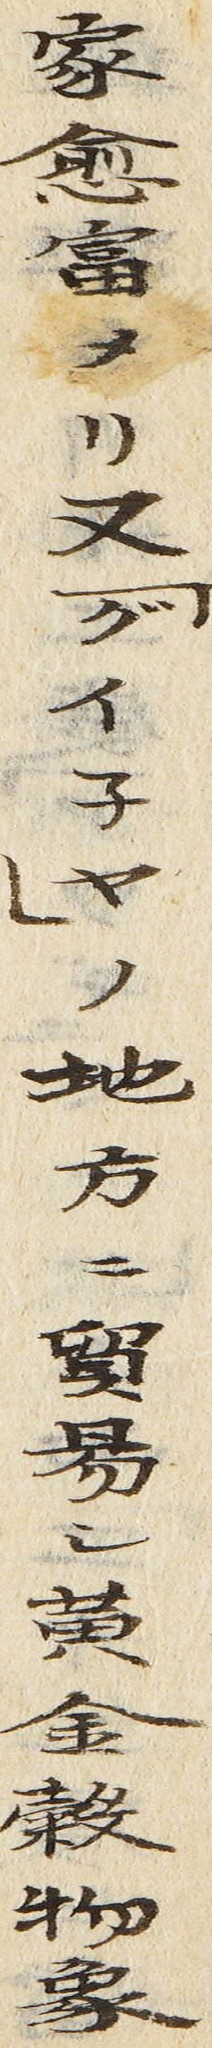家愈富メリ又「グイネヤ」ノ地方ニ貿易シ黄金穀物象
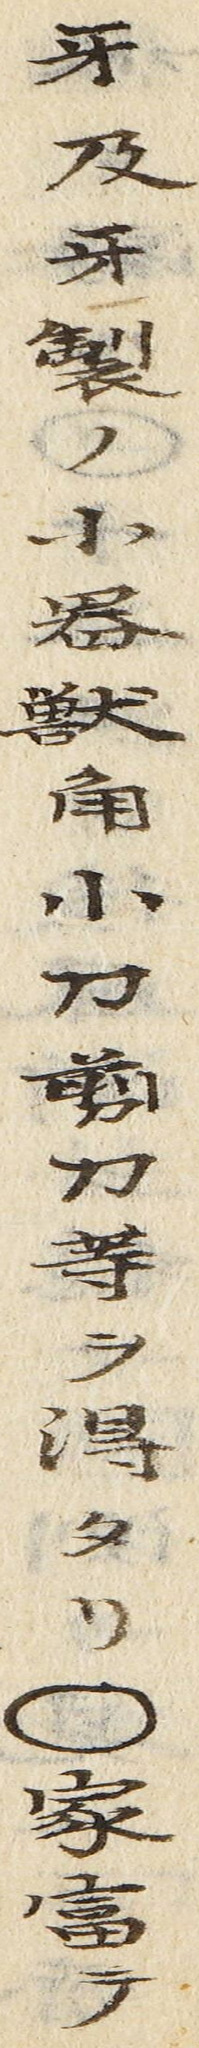牙及牙製ノ小器獣角小刀剪刀等ヲ得タリ◯家富テ
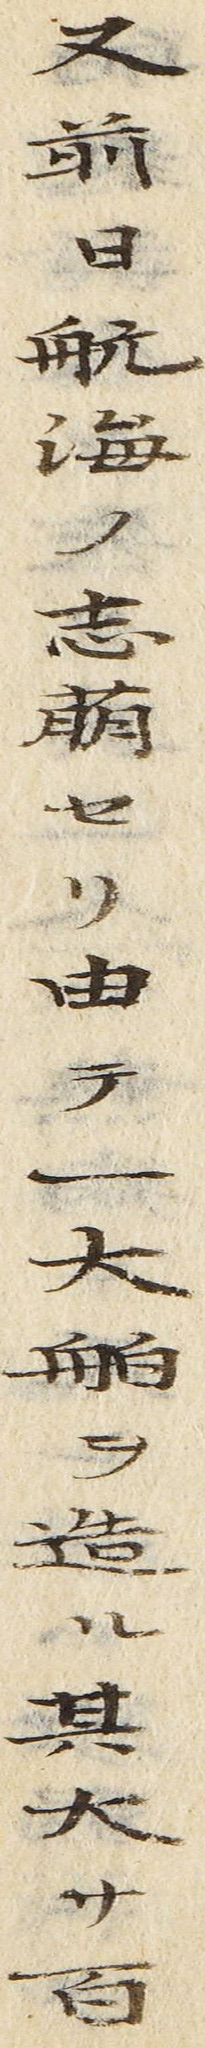又前日航海ノ志萌セリ由テ一大舶ヲ造ル其大サ百
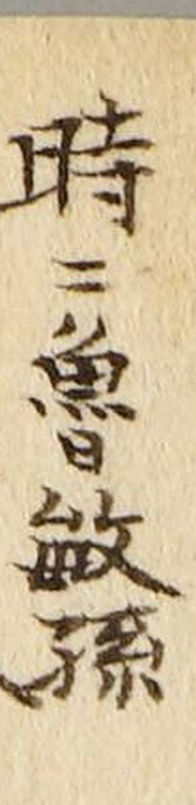時ニ魯敏孫
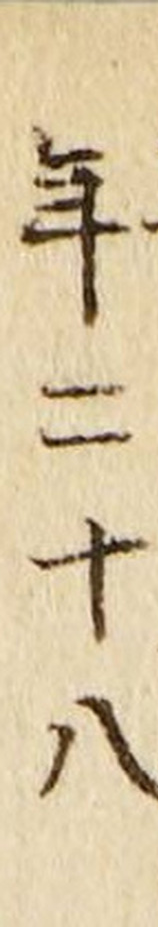年二十八
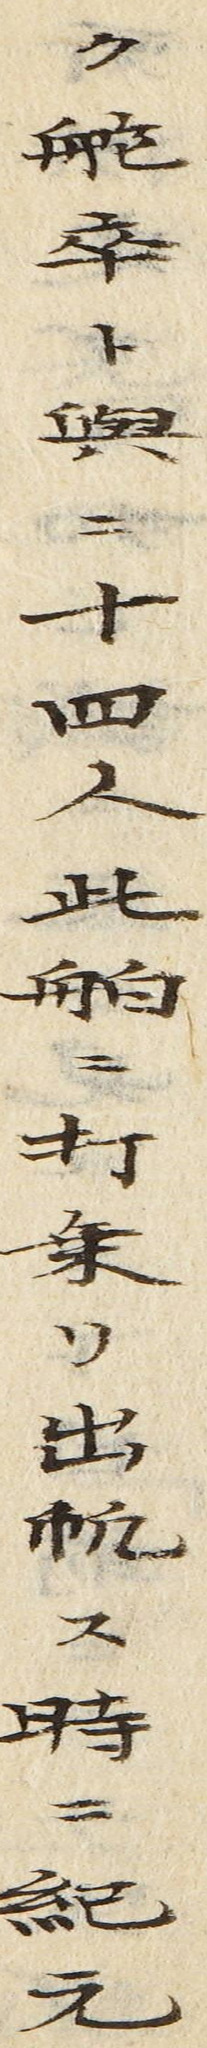ク舵卒ト与ニ十四人此舶ニ打乗リ出帆ス時ニ紀元
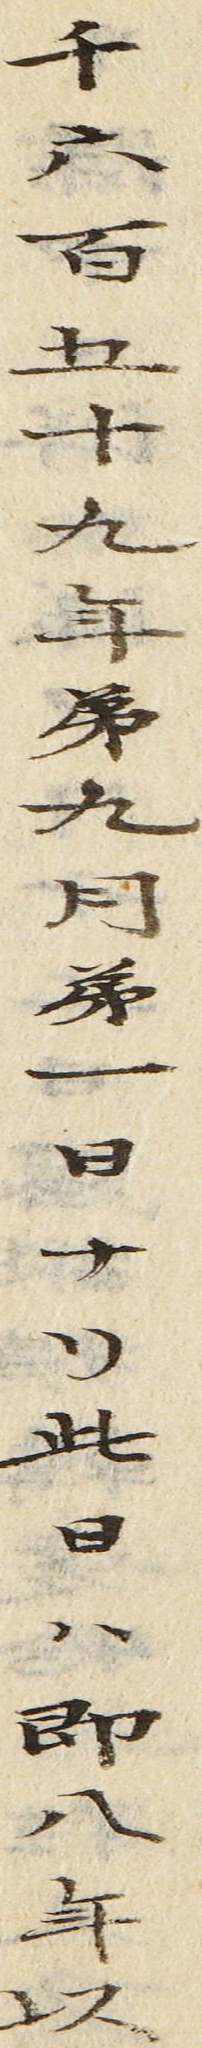千六百五十九年第九月第一日ナリ此日ハ即八年以
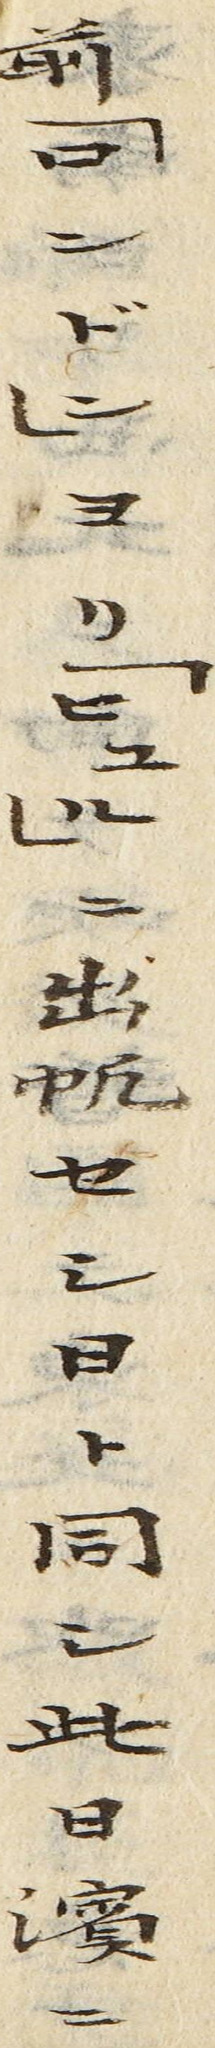前「ロンドン」ヨリ「ヒユル」ニ出帆セシ日ト同シ此日浜ニ
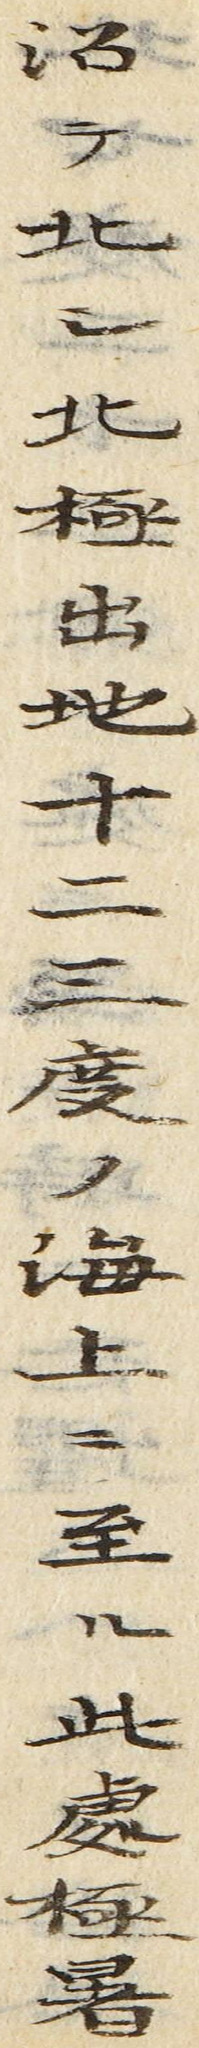沿テ北シ北極出地十二三度ノ海上ニ至ル此処極暑
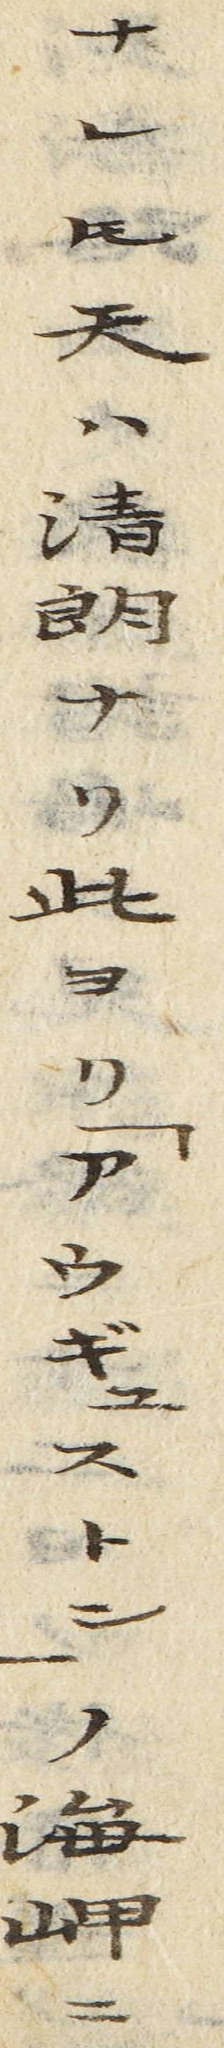ナレトモ天ハ清朗ナリ此ヨリ「アウギユストン」ノ海岬ニ
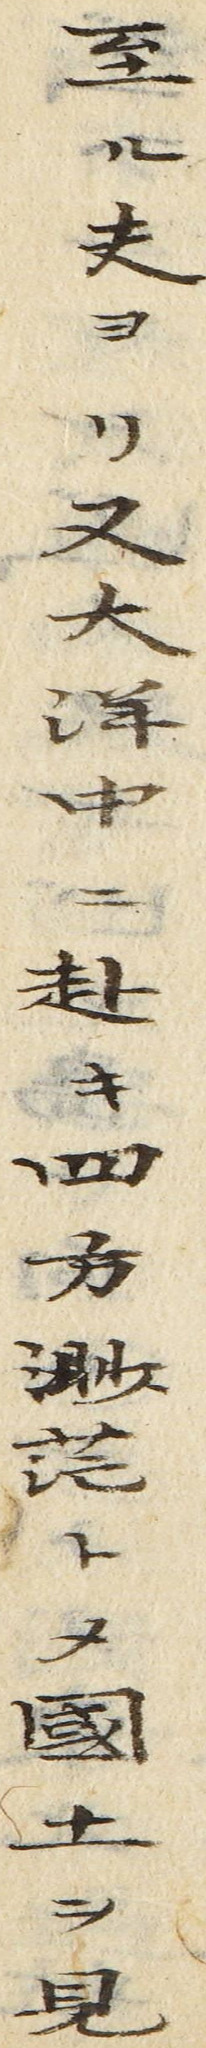至ル夫ヨリ又大洋中ニ赴キ四方渺茫トシテ国土ヲ見

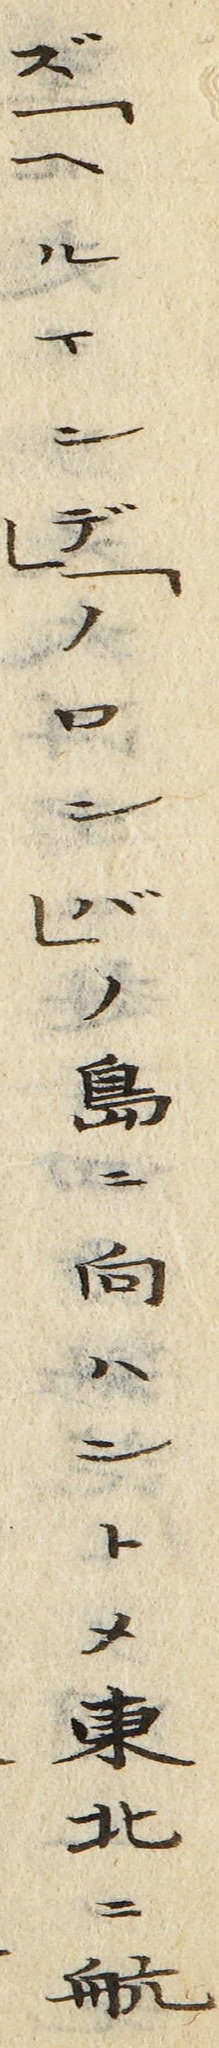ズ「ヘルマンデ」「ノロンバ」ノ島ニ向ハント東北ニ航
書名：漂流紀事
